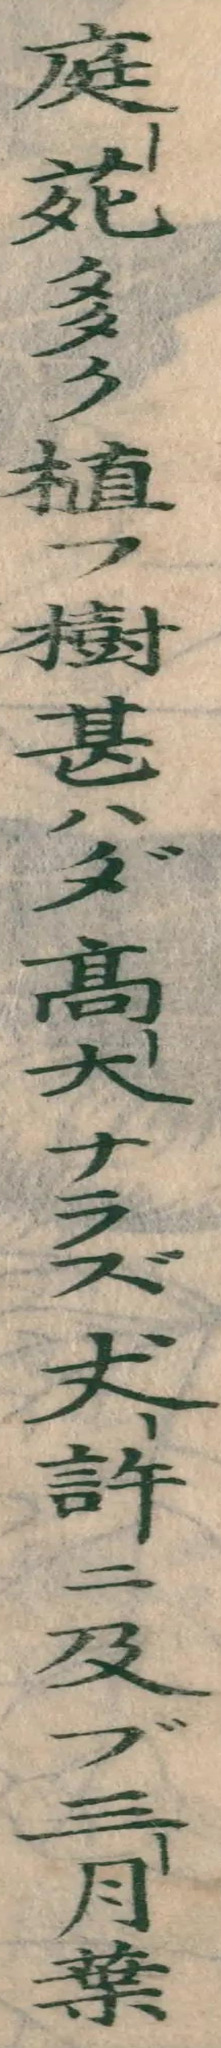庭-苑多ク植フ樹甚ハダ高-大ナラズ丈-許ニ及ブ三-月葉

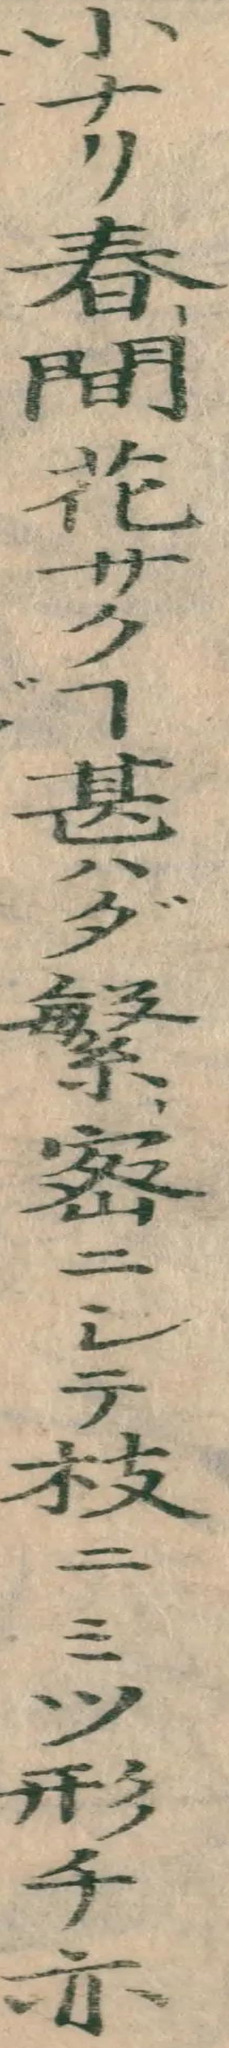小ナリ春-間花サクヿ甚ハダ繁-密ニシテ枝ニミツ形チ亦
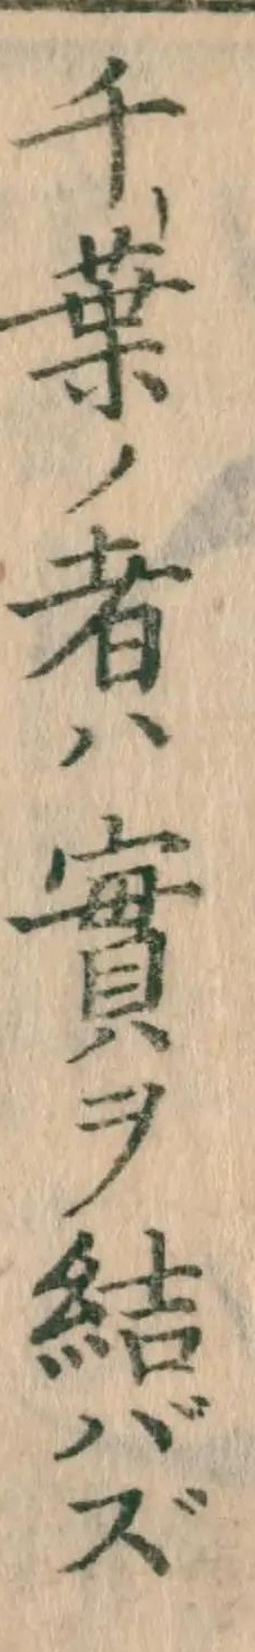千-葉ノ者ハ実ヲ結バズ

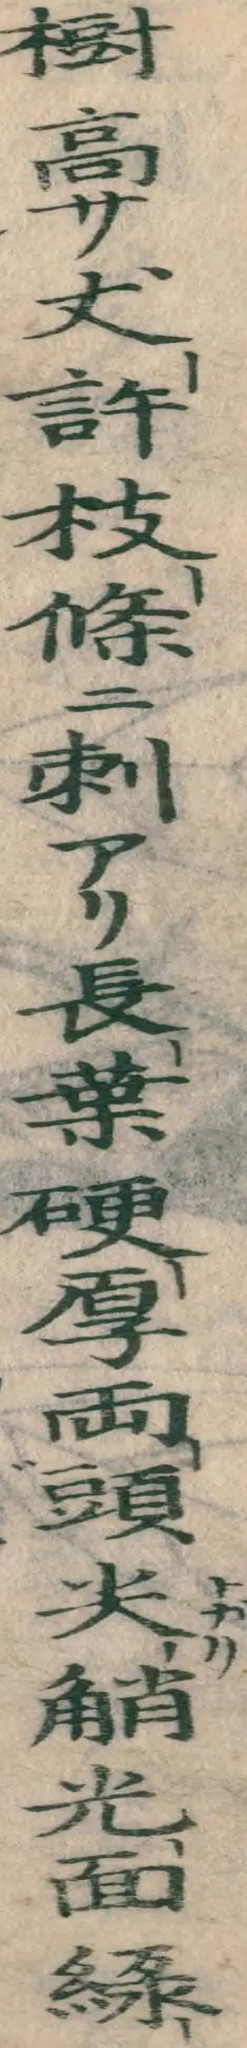樹高サ丈-許枝-条ニ刺アリ長-葉硬-厚両-頭尖-𧣪トガリ光-面緑-
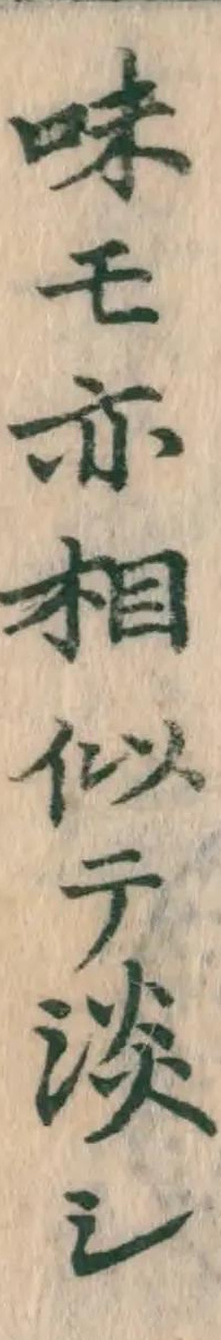味モ亦相似テ淡シ
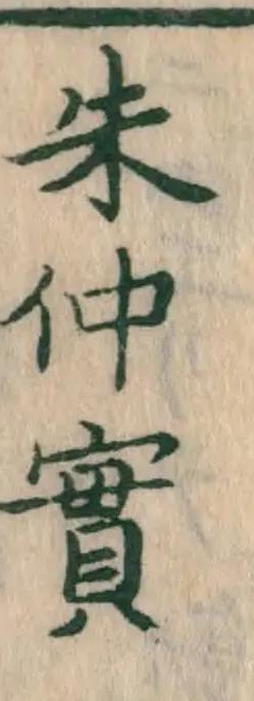朱仲実

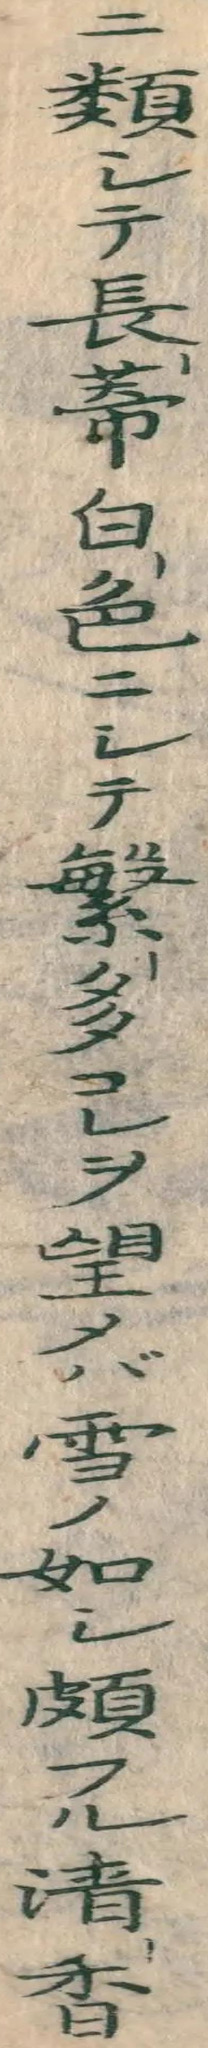ニ類シテ長-蒂白-色ニシテ繁-多コレヲ望メバ雪ノ如シ頗フル清-香
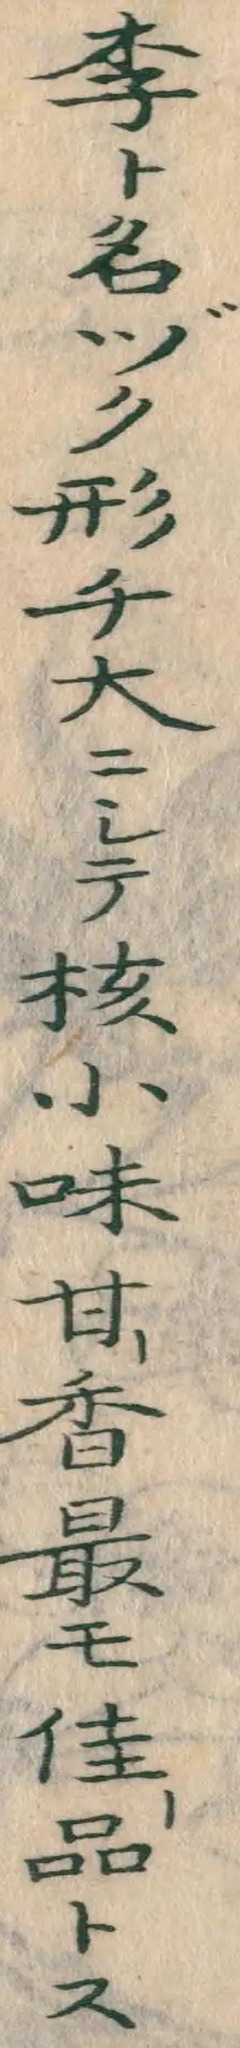李ト名ヅク形チ大ニシテ核小味甘-香最モ佳-品トス

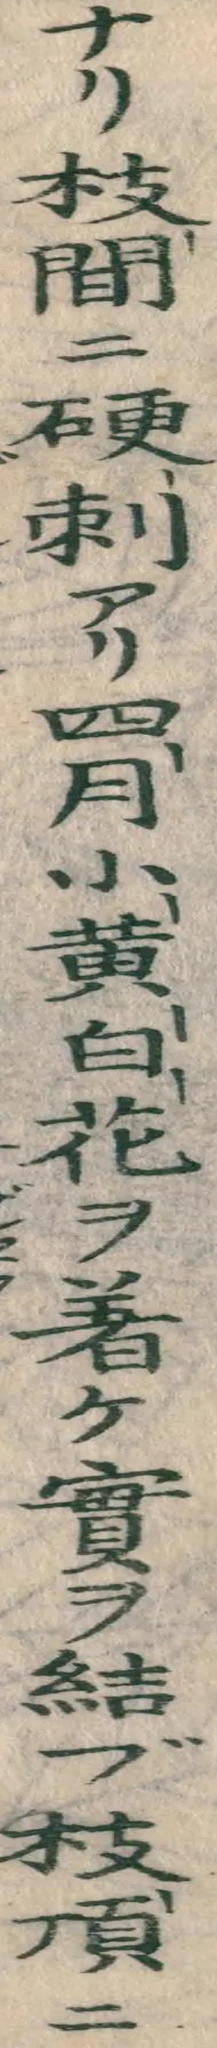ナリ枝-間ニ硬-刺アリ四-月小-黄-白-花ヲ着ケ実ヲ結ブ枝-頂ニ
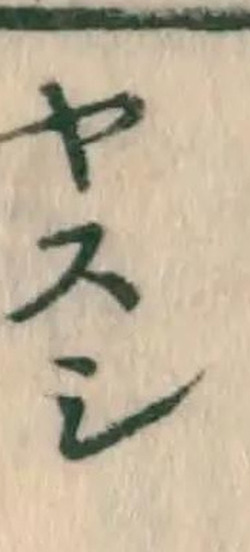ヤスシ

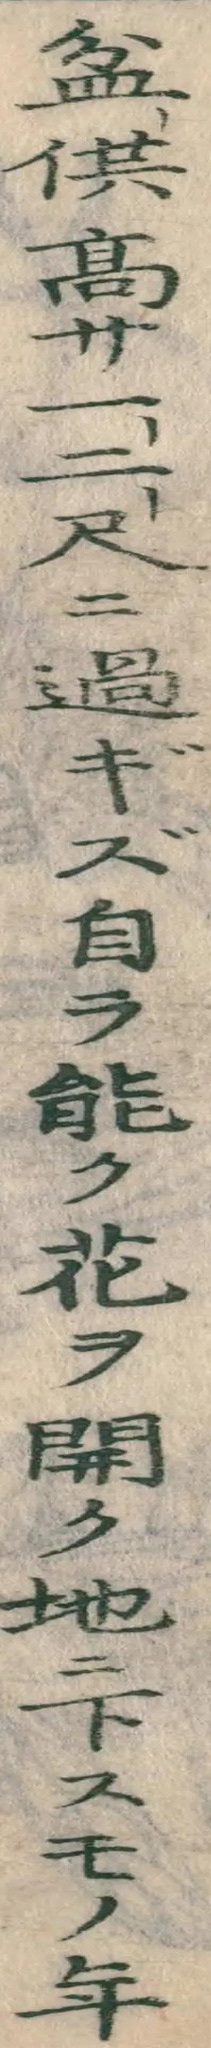盆-供高サ一-二-尺ニ過ギズ自ラ能ク花ヲ開ク地ニ下スモノ年
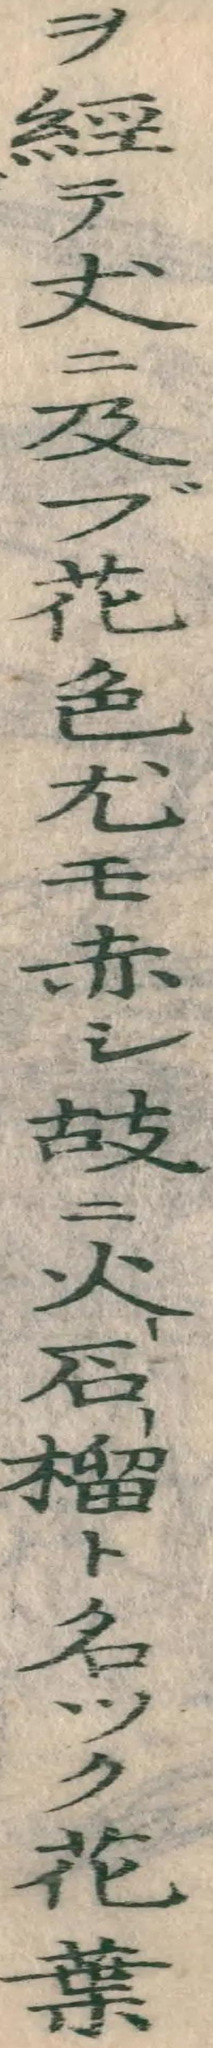ヲ経テ丈ニ及ブ花色尤モ赤シ故ニ火-石-榴ト名ツク花葉
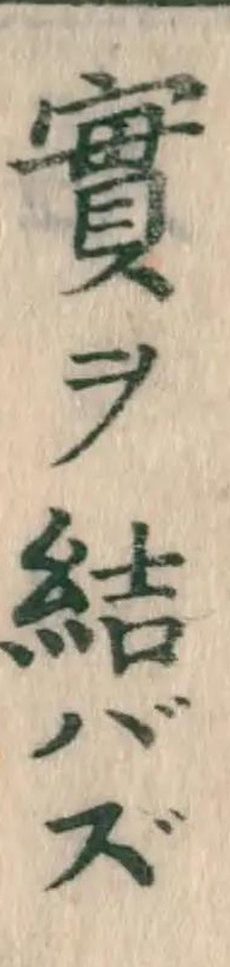実ヲ結バズ

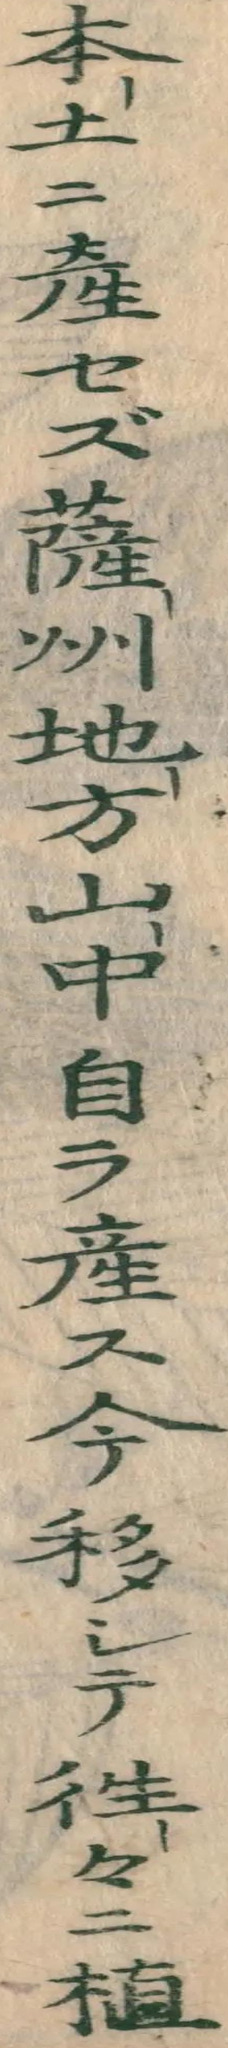本-土ニ産セズ薩-州地-方山-中自ラ産ス今移シテ往-々ニ植
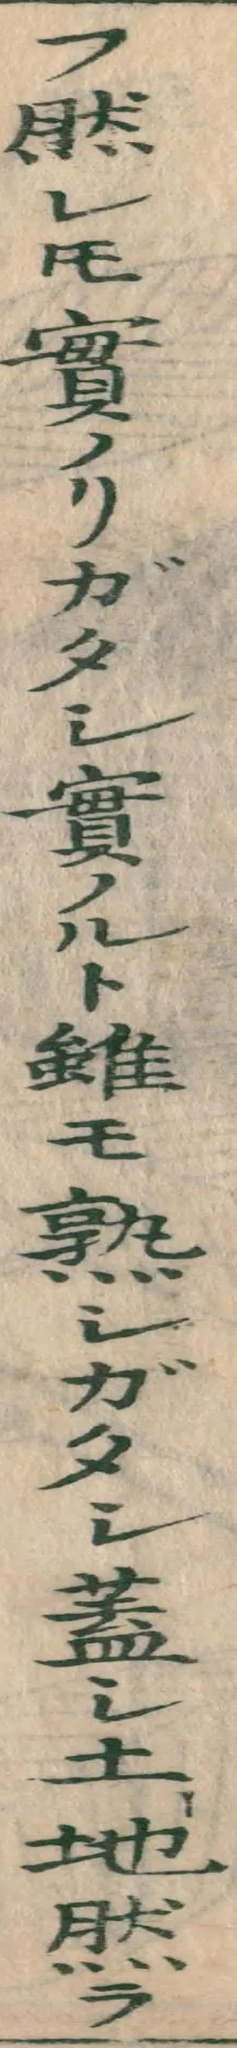フ然レ𪜈実ノリガタシ実ノルト雖モ熟シガタシ蓋シ土-地然ラ
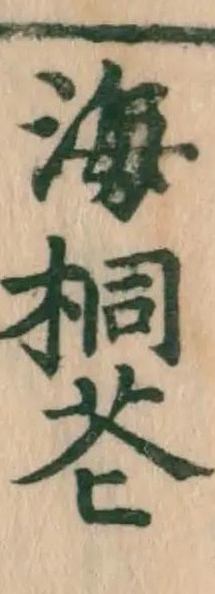海桐花
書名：花彙 草部4巻木部4巻. [2]
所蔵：国立国会図書館 National Diet Library, JAPAN
